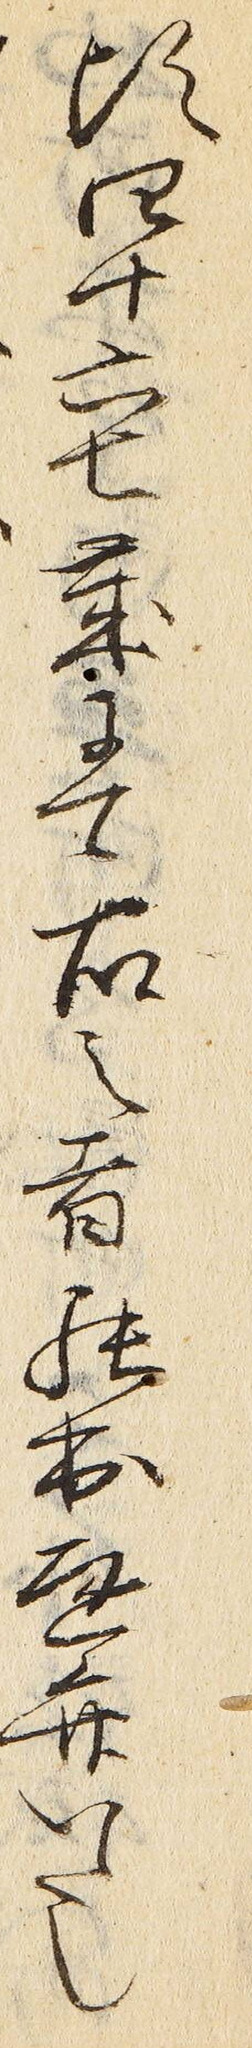頃四十六七歳にて右之者罷出通弁いたし
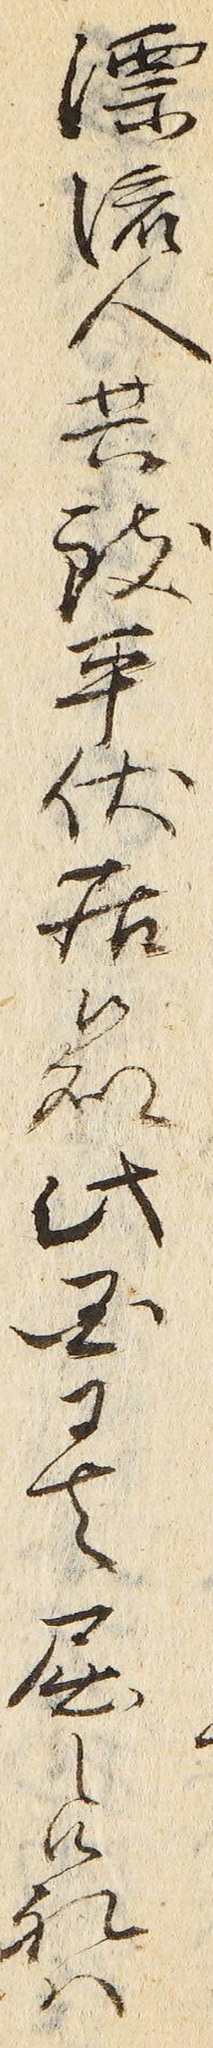漂流人共致平伏居候処此国には屈し候礼は
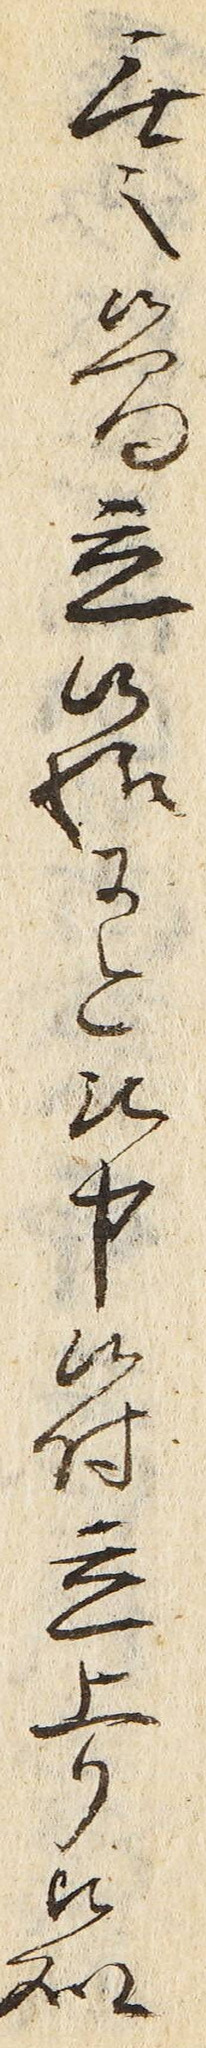無之候間立候様にと被申候付立上り候処
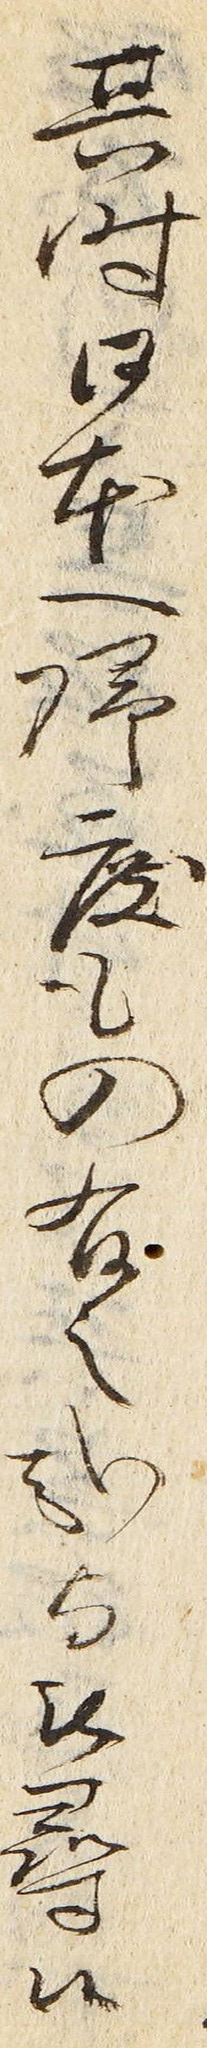其時日本へ帰度もの有之哉と被尋候
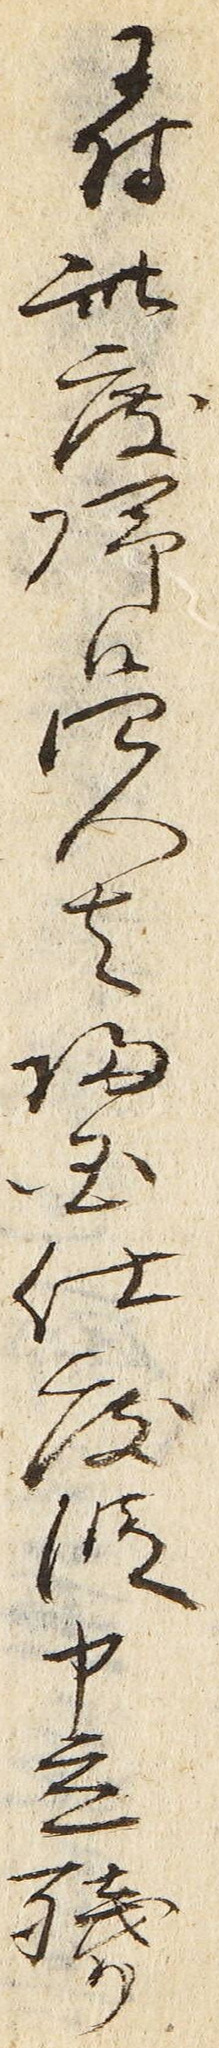に付此度帰候四人は帰国仕度段申立残り
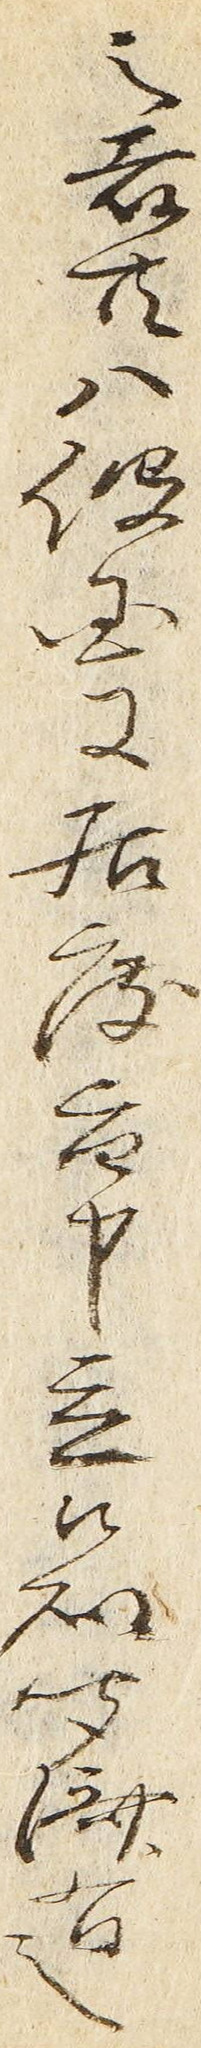之者共は彼国に居度旨申立候処聞済有之
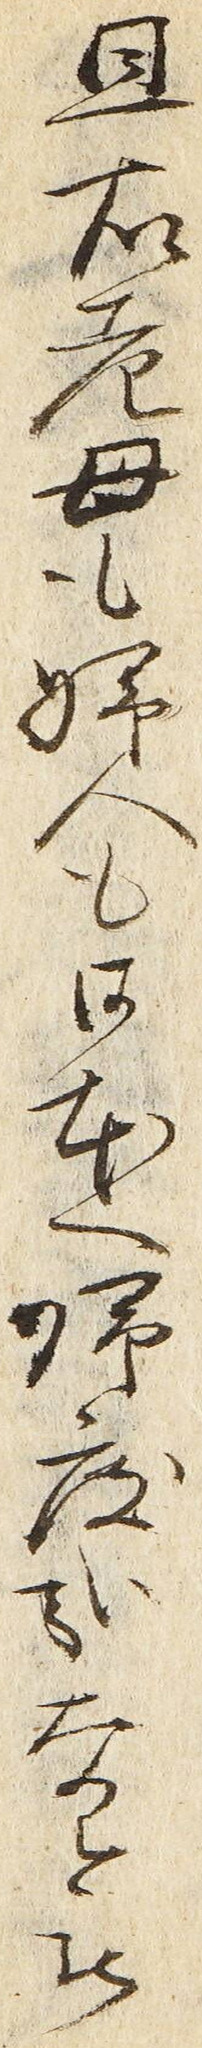且右老母も婦人も日本へ帰度哉なと被
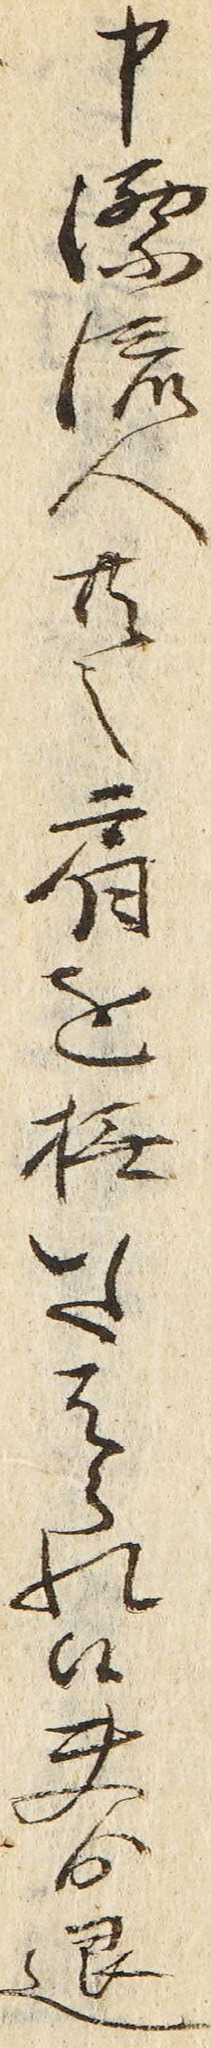申漂流人共之肩を撫いたはられ候夫ゟ退
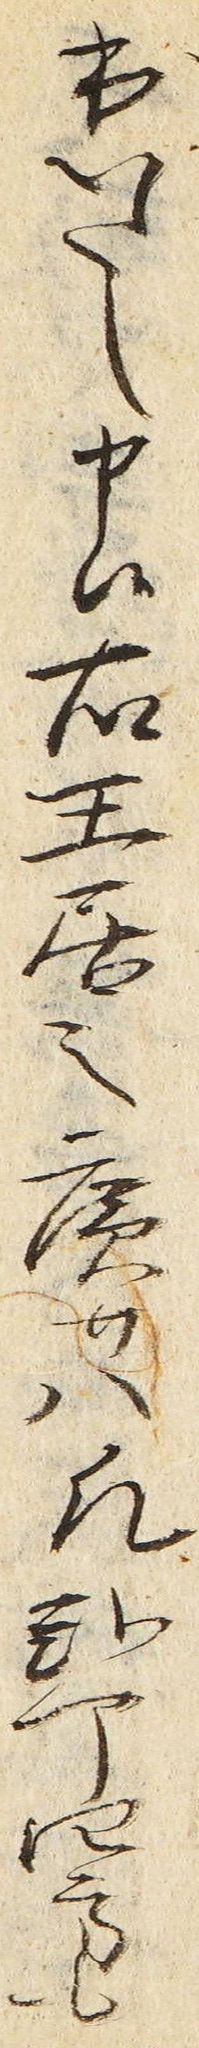出いたし申候右王居之広サは凡弐丁四方も
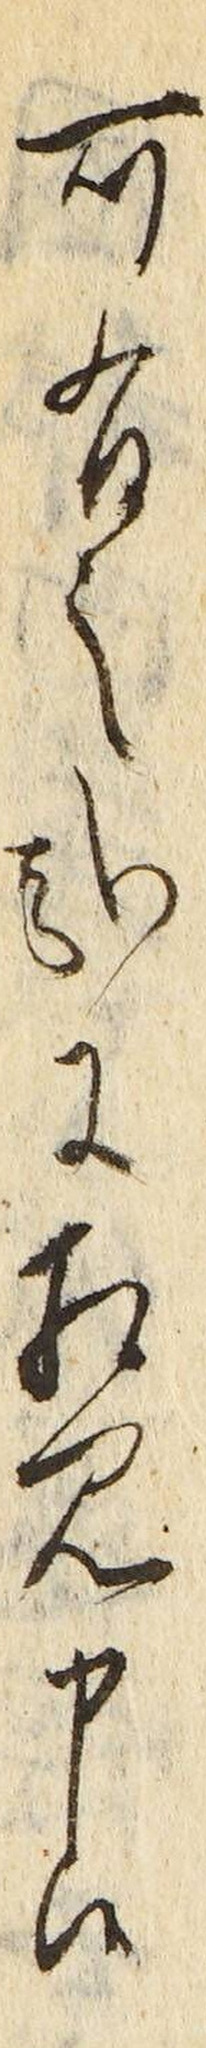可有之哉に相見申候

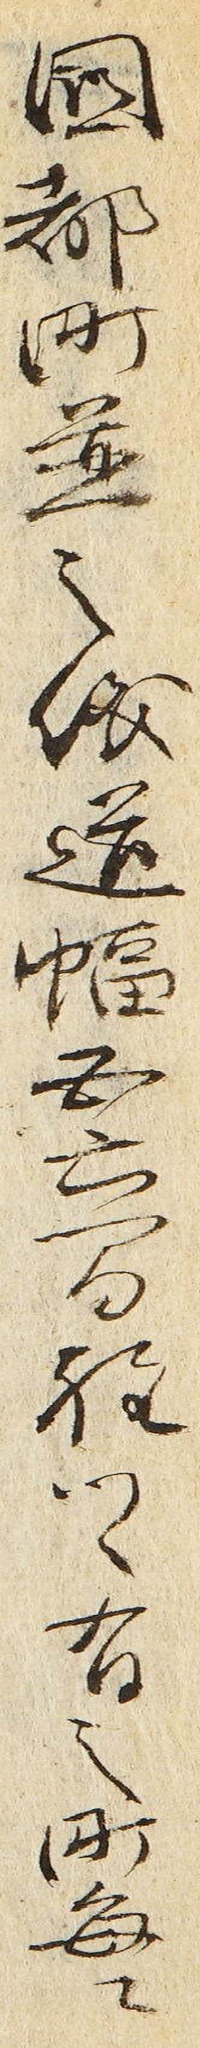国都町並之儀道幅五六尺程ツヽ有之町毎に
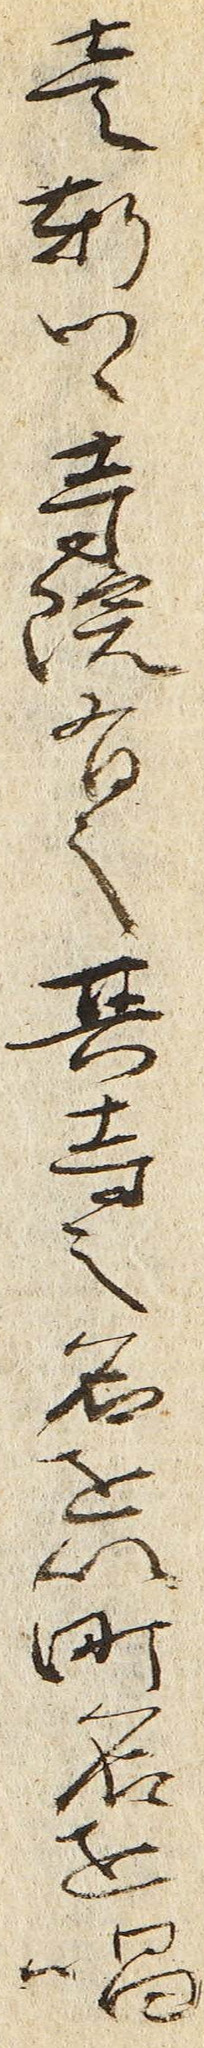壱軒ツヽ寺院有之其寺之名を以町名を唱
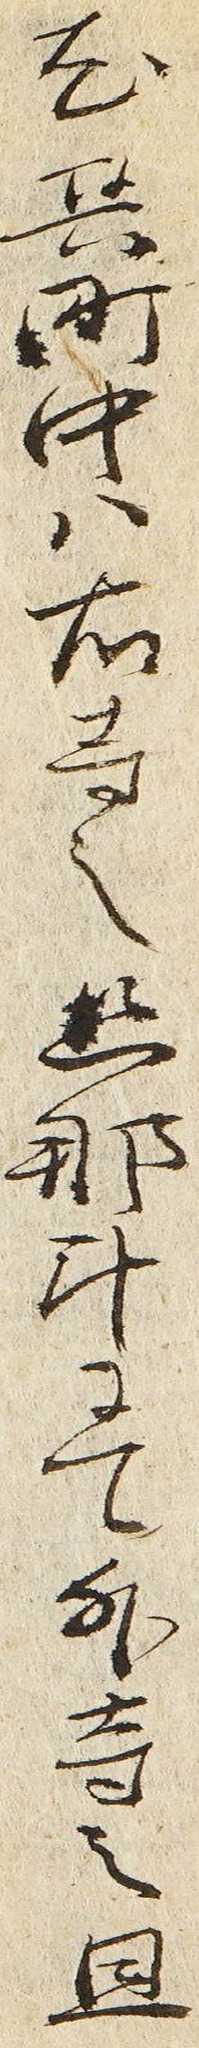尤其町中ハ右寺之旦那斗にて外寺之旦
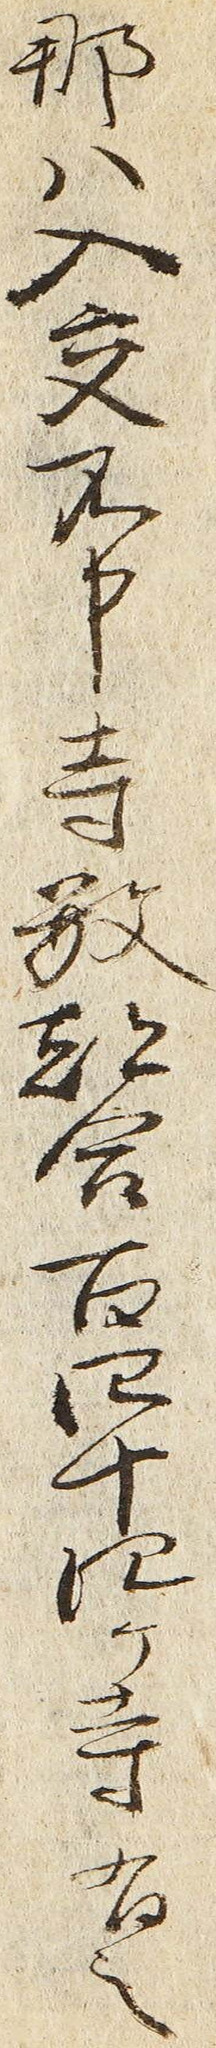那は入交不申寺数都合百四十四ヶ寺有之
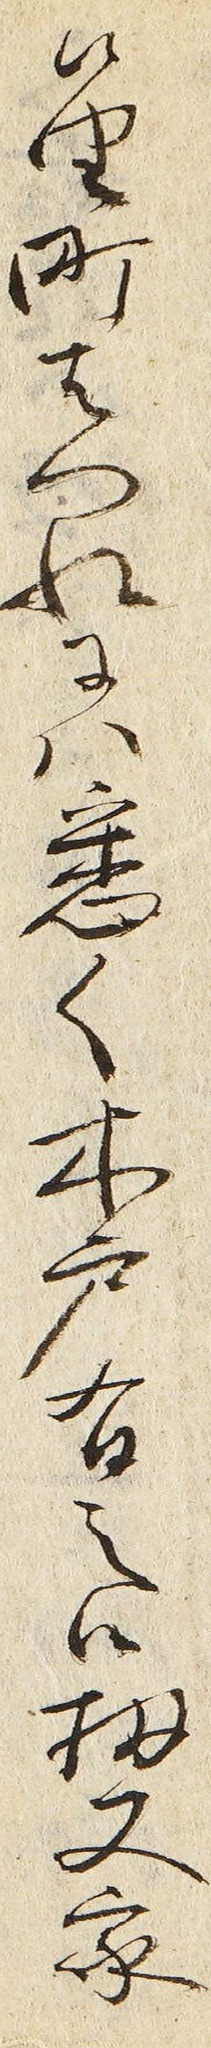候由町はつれには悉く木戸有之候扨又家
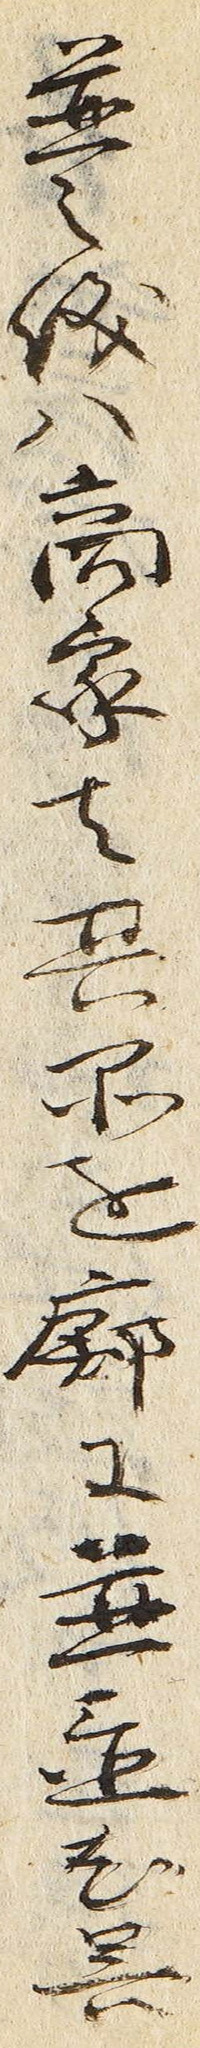並之儀は商家は其品を廓に並置尤呉
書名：漂民後記
